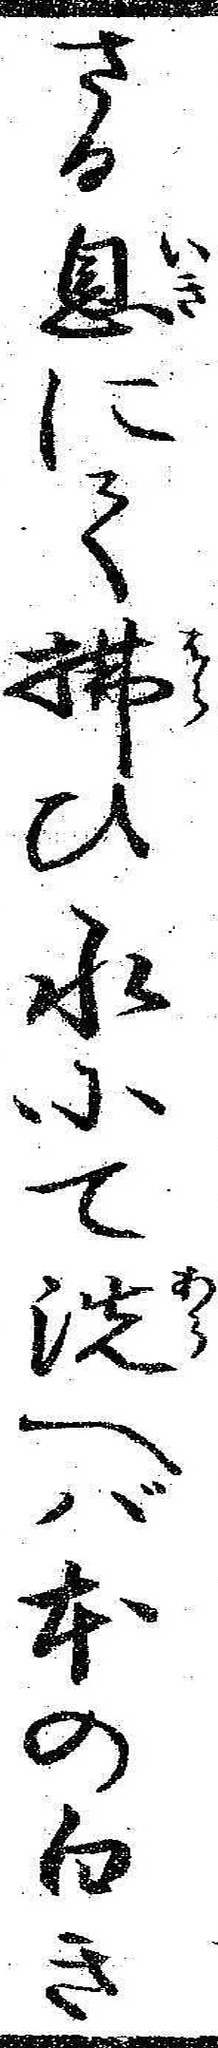さる息にて払ひ水にて洗へば本の白き
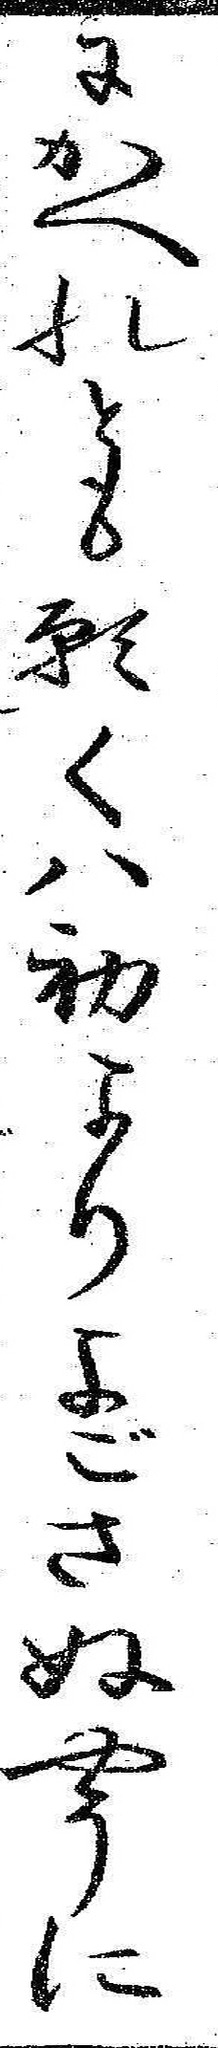にかへれとも願くは初よりよごさぬやうに
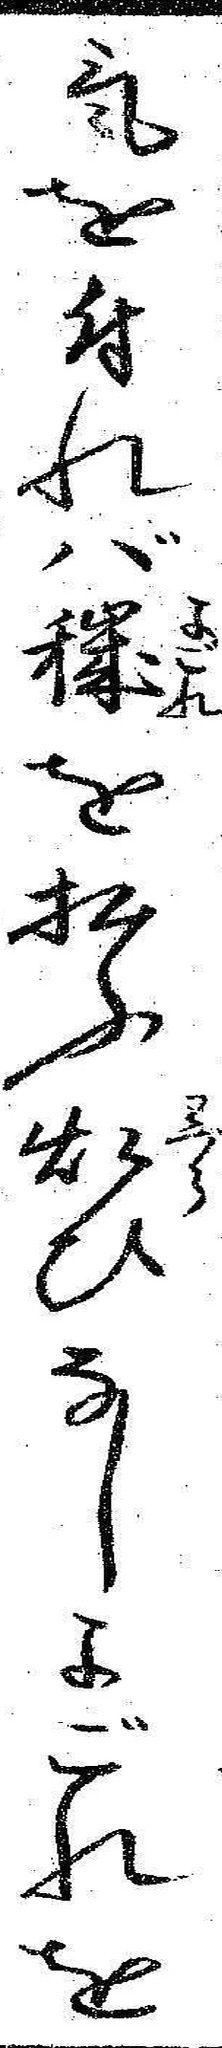気を付れば穢を払ふ煩ひなしよごれを
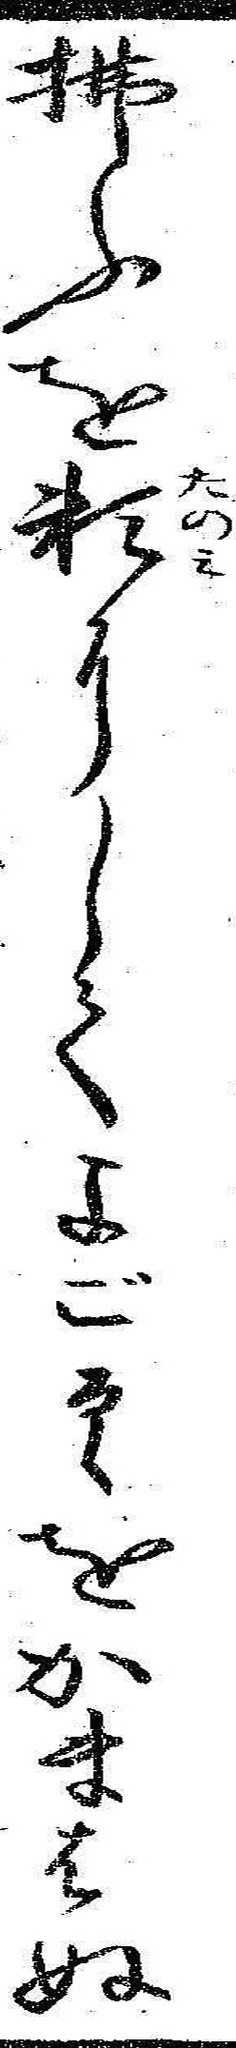払ふを頼にしてよごるゝをかまはぬ
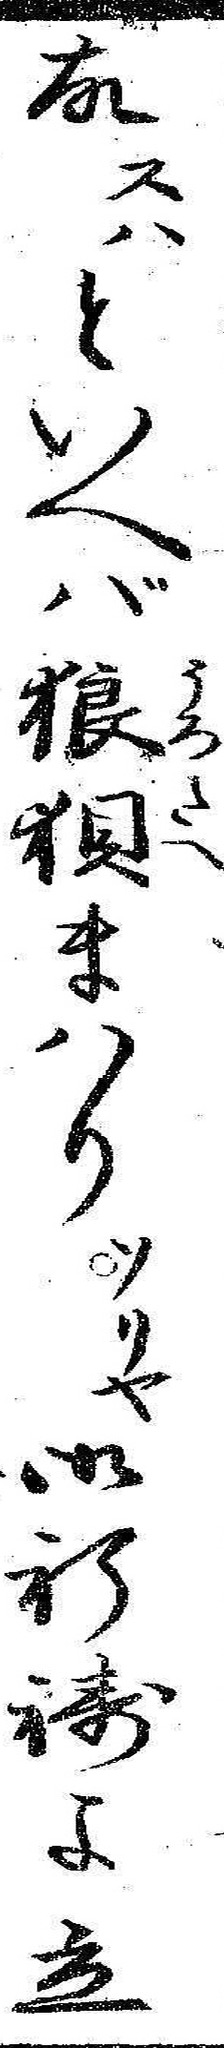故狼狽まはり御祈祷よ立
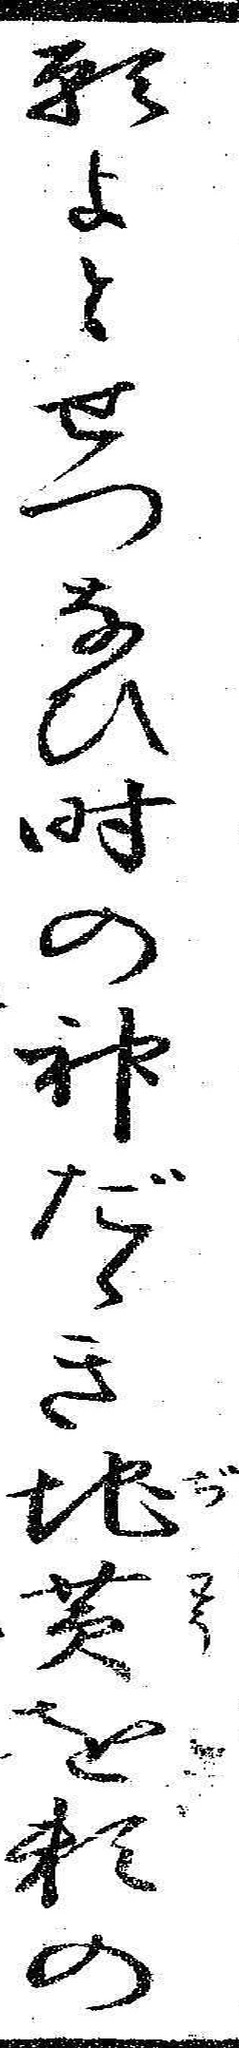願よとせつなひ時の神だゝき地黄を頼の
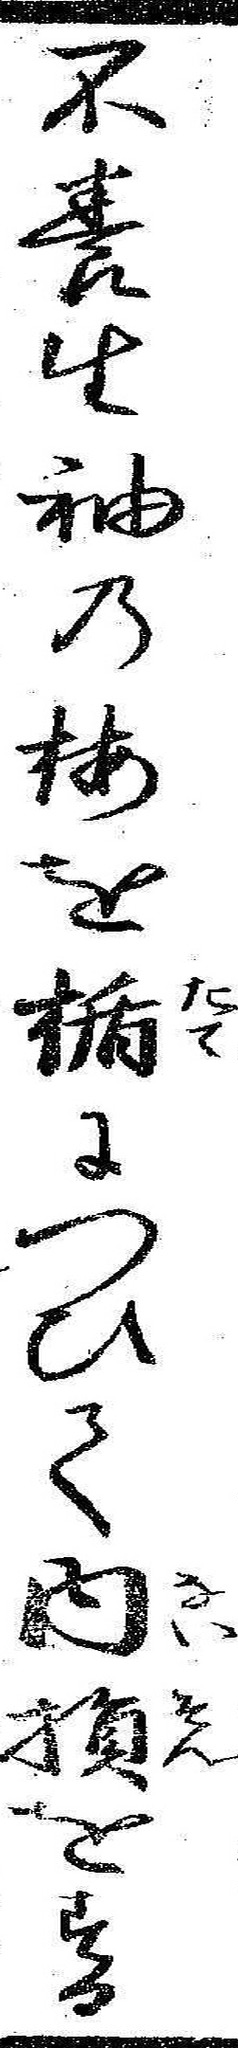不養生袖の梅を楯につひて内損をする
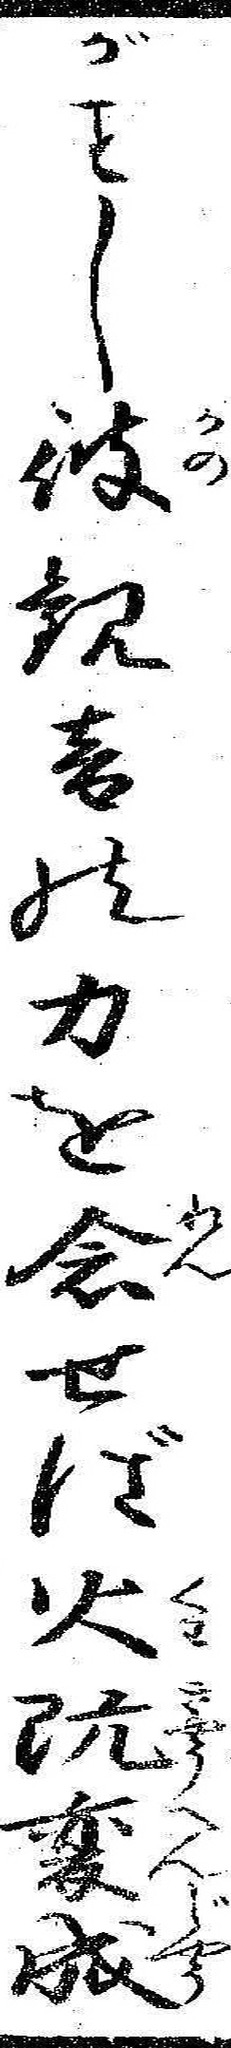がことし彼観音の力を念せば火阬変成
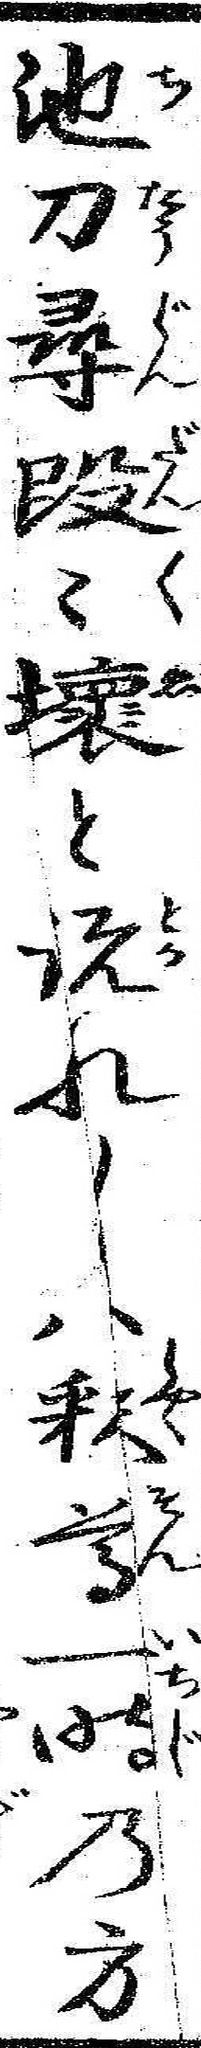池刀尋段々壊と説れしは釈尊一時の方
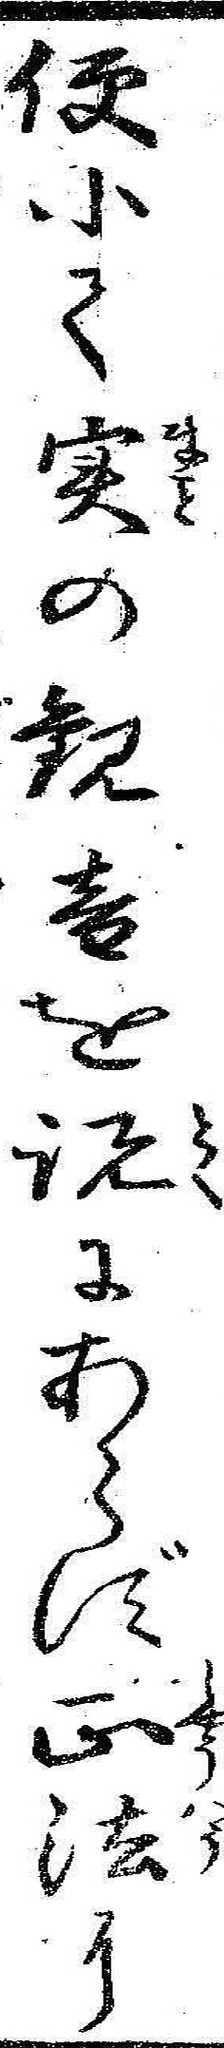便にて実の観音を説にあらず正法に
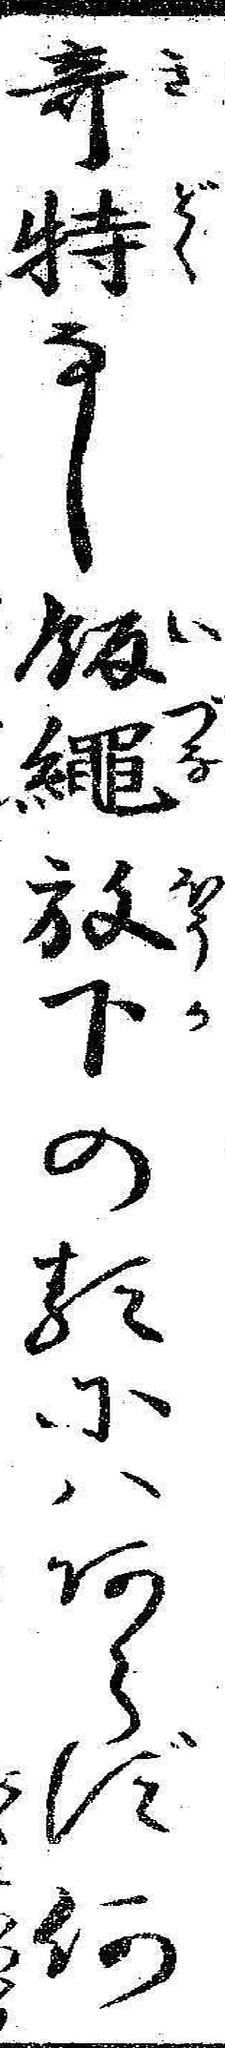奇特なし飯縄放下の類にはあらず何
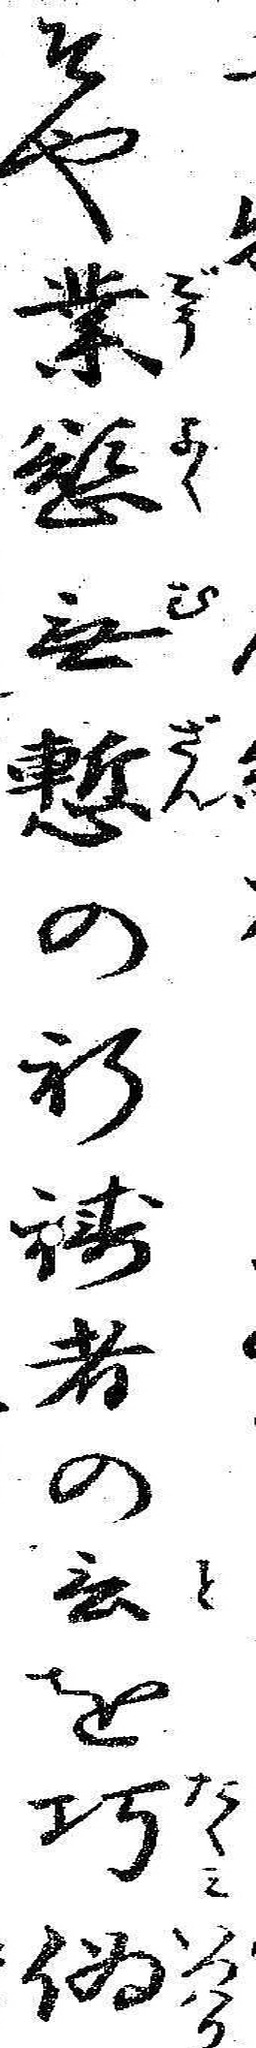そや業慾無慙の祈祷者の云を巧偽
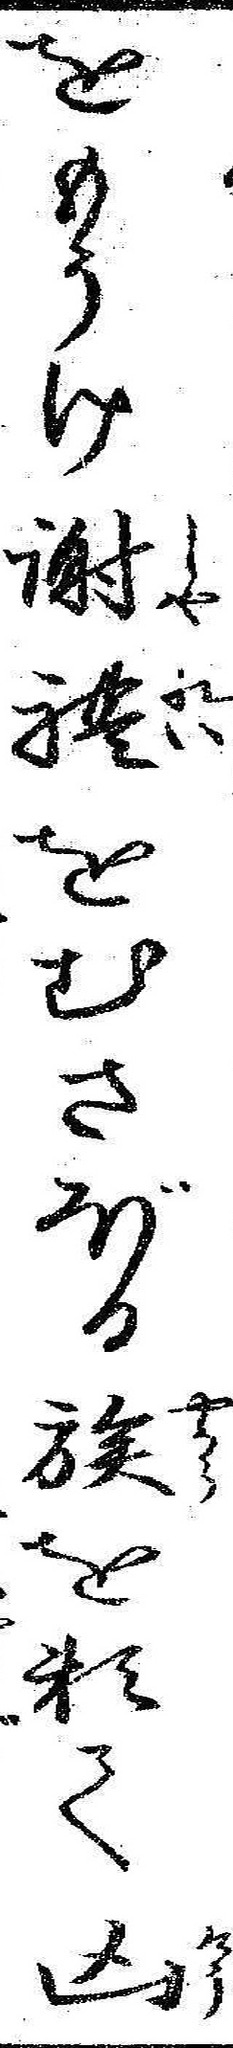をもうけ謝礼をむさぼる族を頼て凶
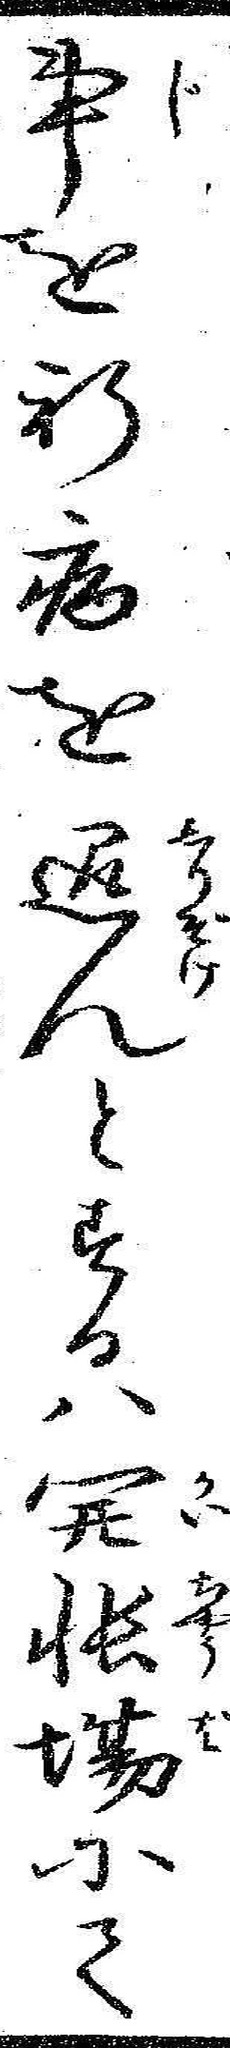事を祈病を退んとするは開帳場にて
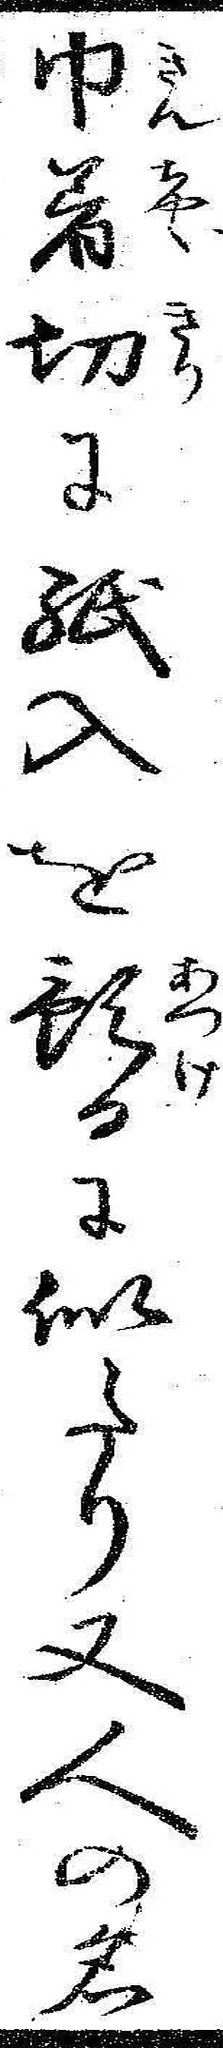巾着切に紙入を預るに似たり又人の名
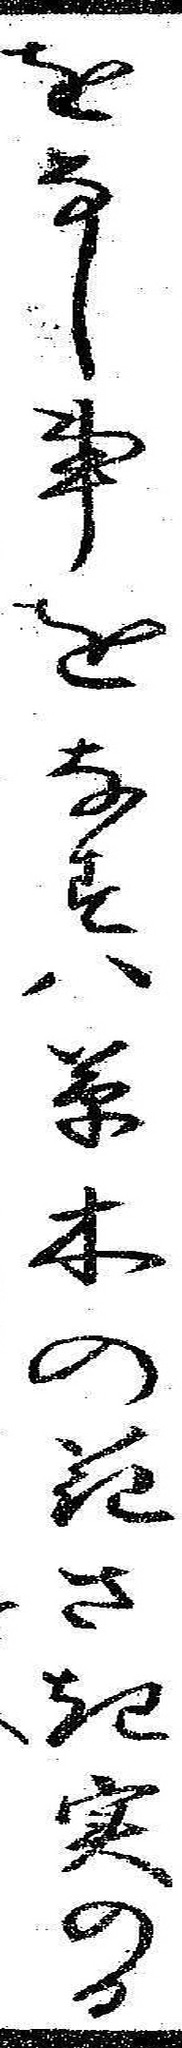をなし事をなすは草木の花さき実のる
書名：根無草後編
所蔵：国文学研究資料館
